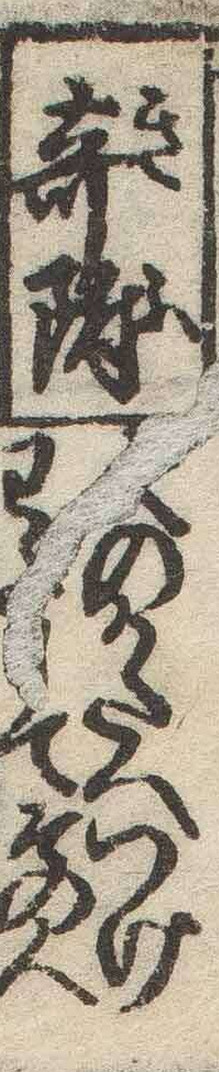寄附ひとのかたへつけ
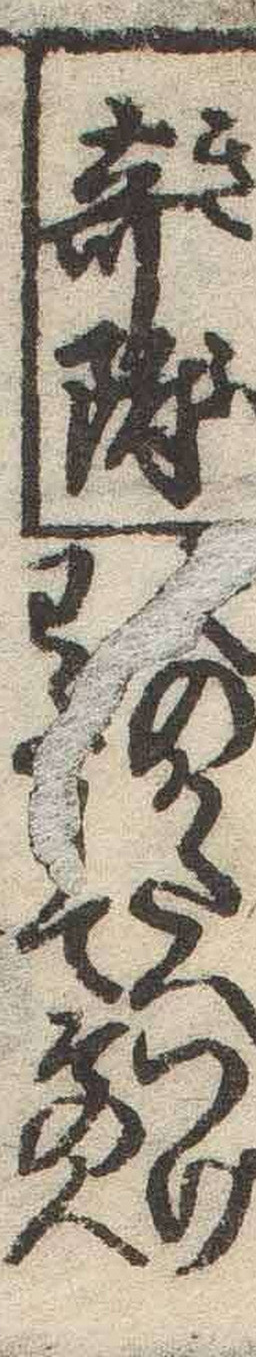わたしてその人
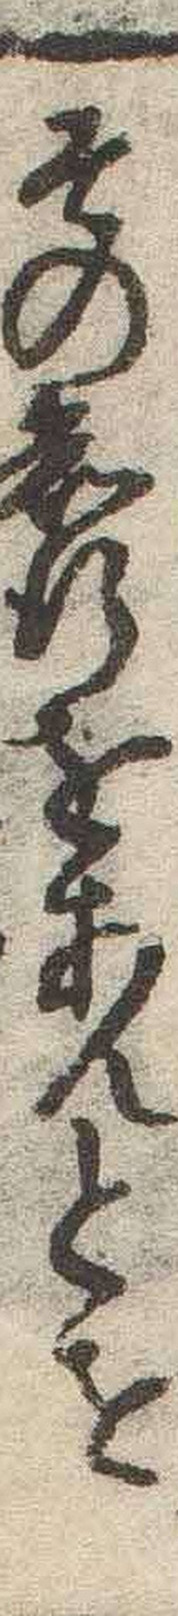その知行をあんとを
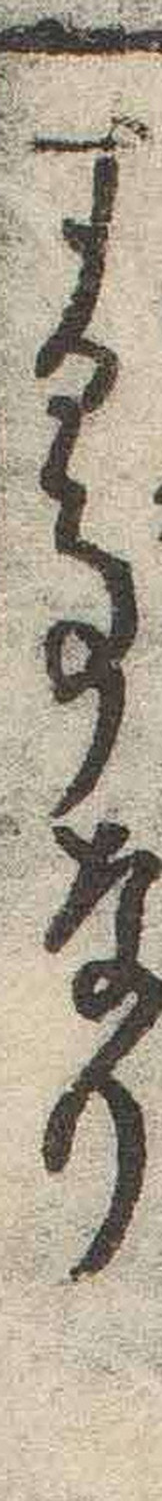する事なり
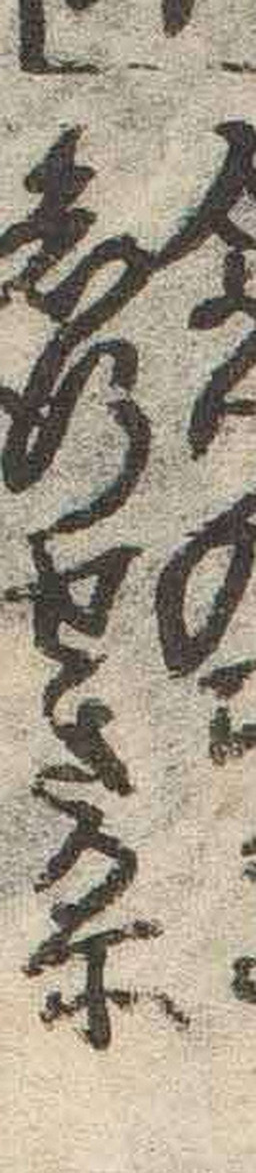知行せさる所
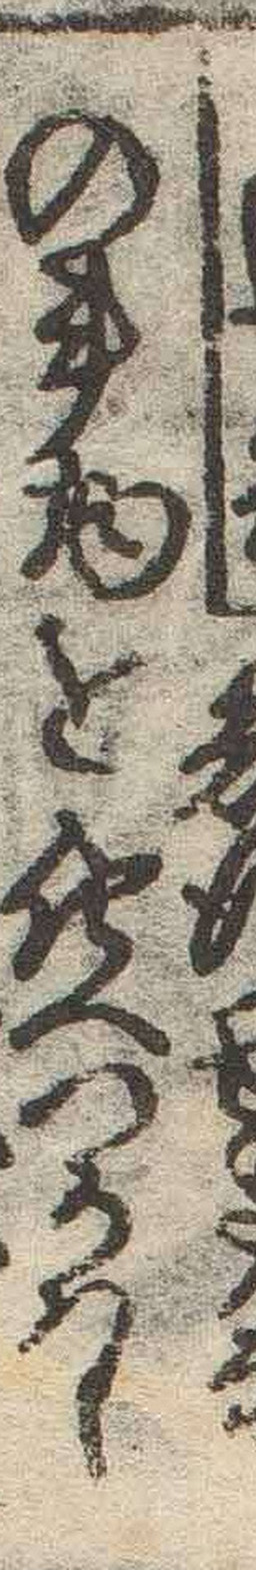の事物を他へつかはし
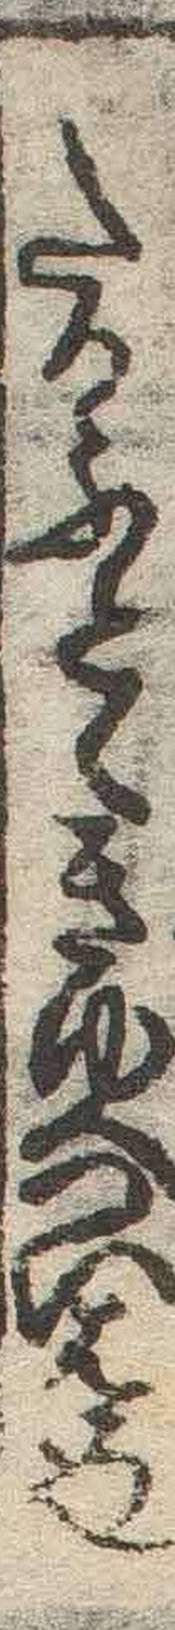たるふとゝきゆへついはう也
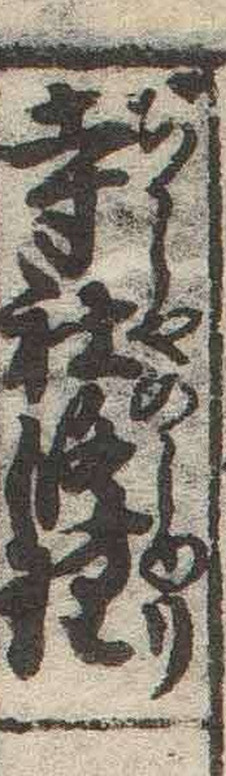寺社修理
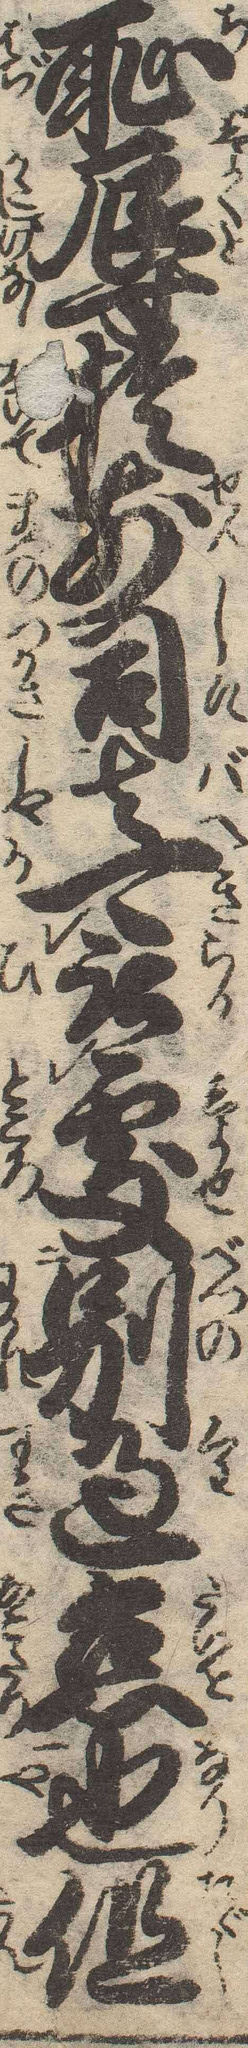恥辱於前司者可被處別過怠也但
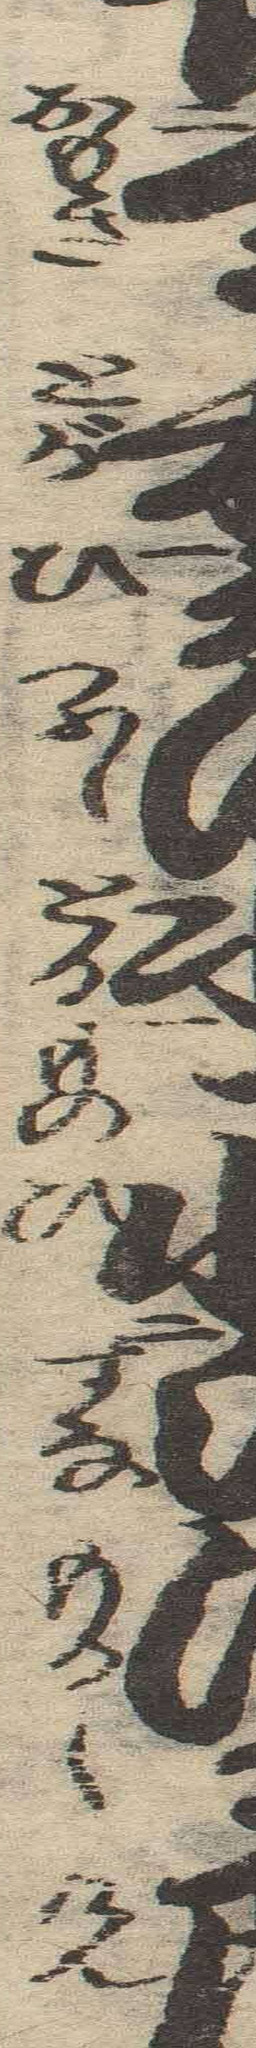ゑおもきとがひつふしとるものひすなもるしけん

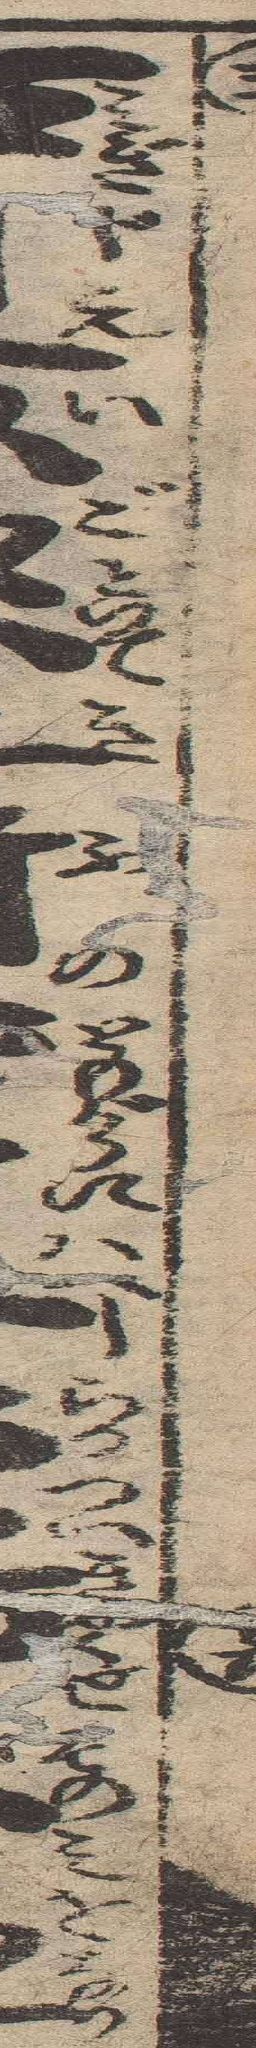みぎじこんいごをいてきふのともがらにはへしらるついきやくせそのみをなり
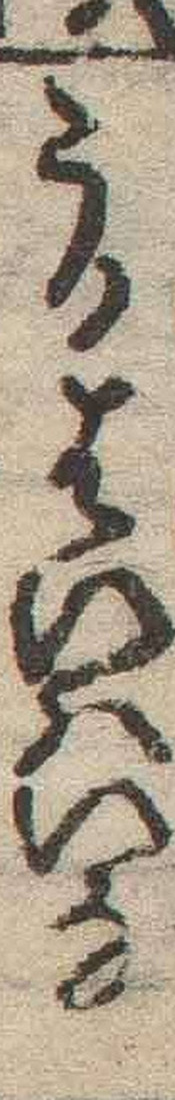うるはいはいな
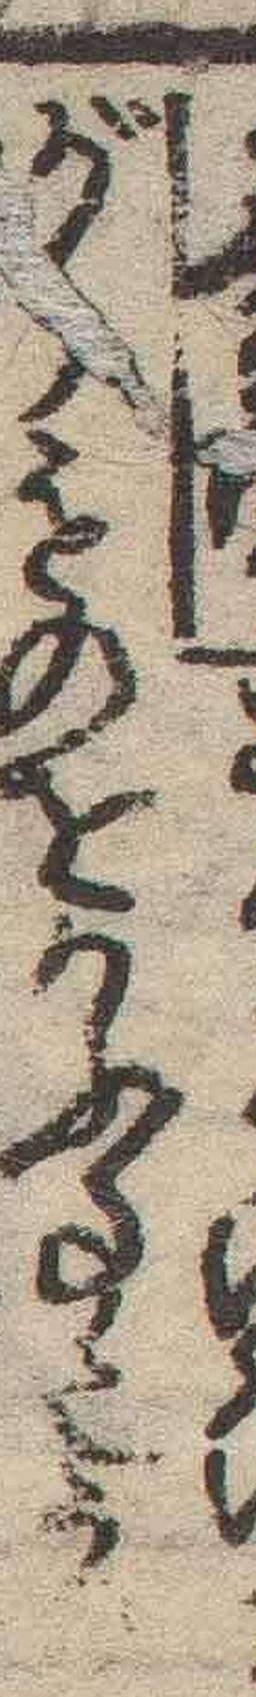がらものをうる事也うり
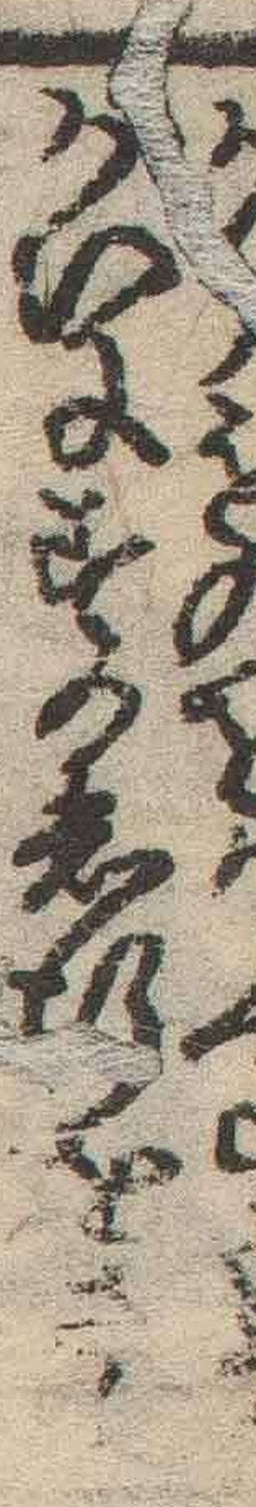かいにその知行をさし
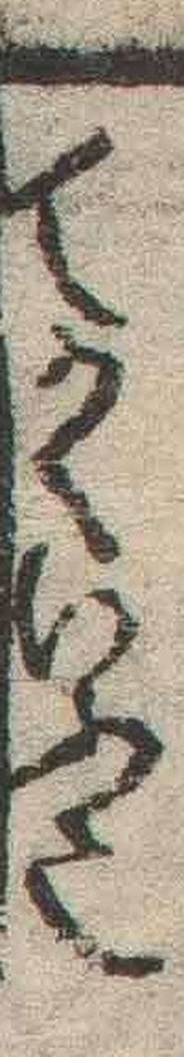てかくいふ也
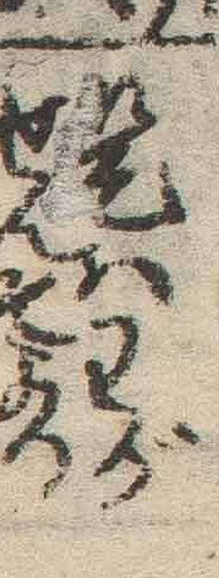せんそより
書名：御成敗式目絵抄
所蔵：東京学芸大学附属図書館 国文学研究資料館
